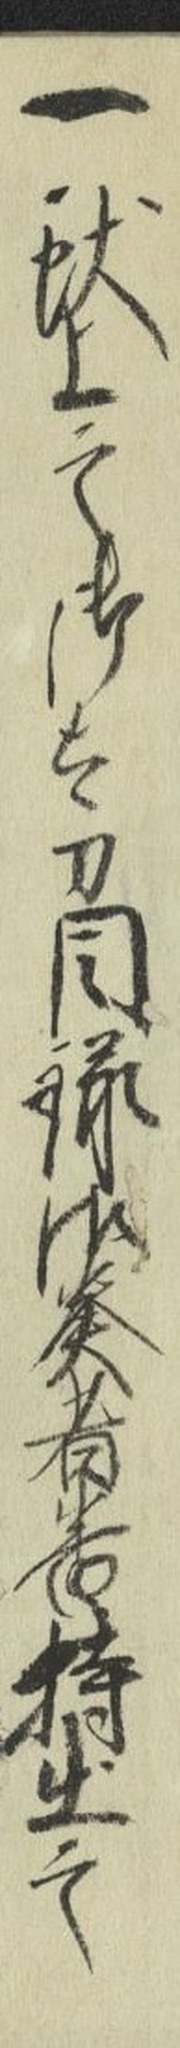一献上之御太刀目録御奏者番持出之

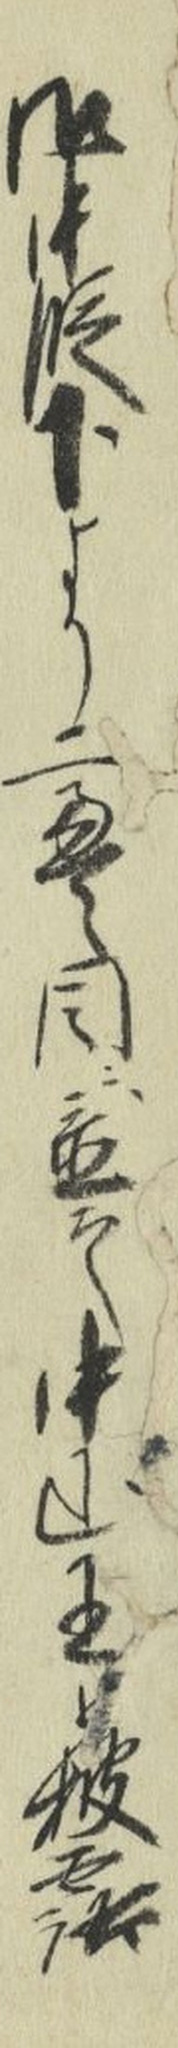御中段下より二畳目に置之中山王と披露
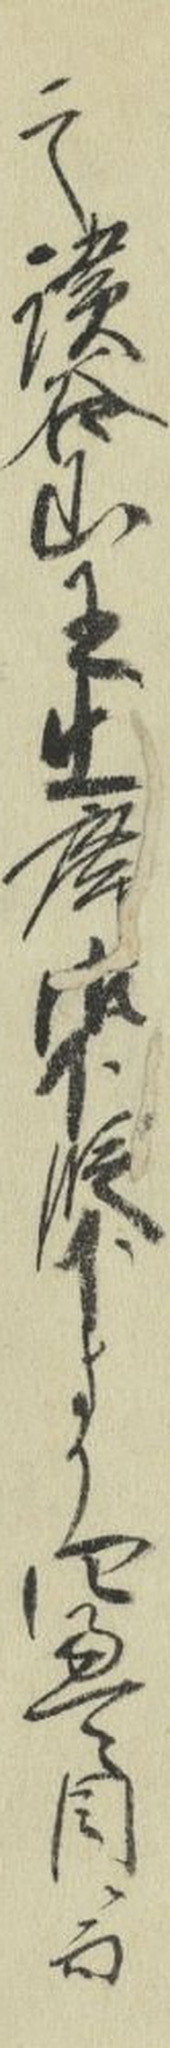之読谷山王出座御下段下より四畳目に而
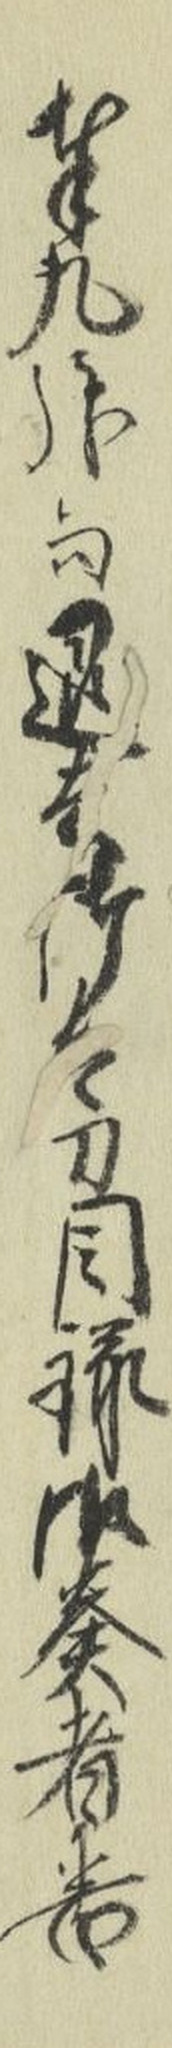奉九拝而退去御太刀目録御奏者番
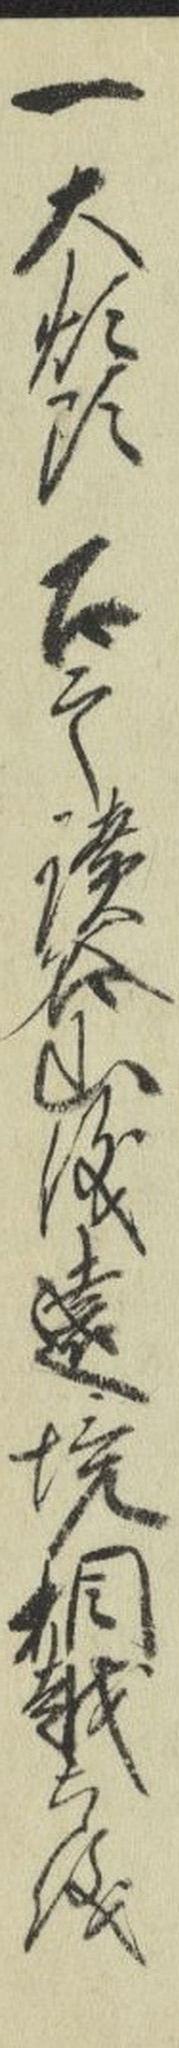一大炊頭召之読谷山儀遠境相越之儀
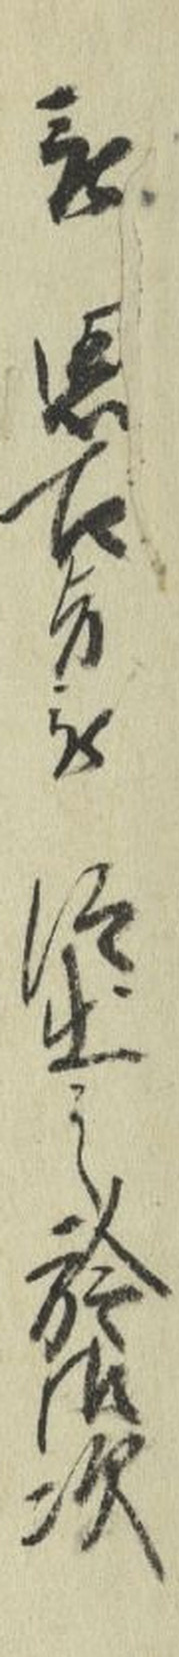被思召旨被仰出之於御次
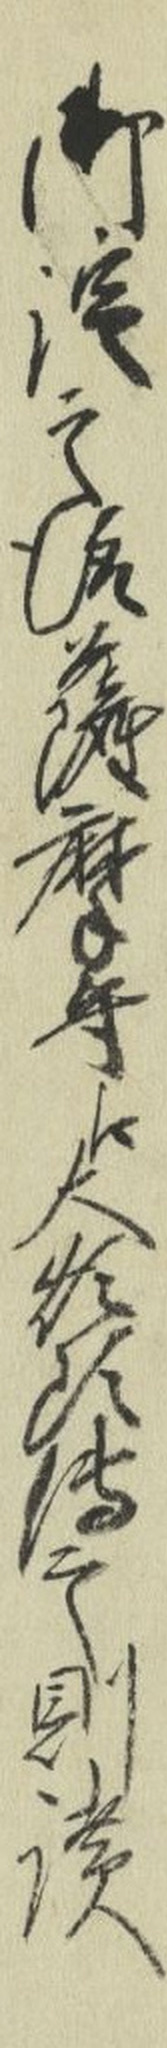御詫之趣薩摩守え大炊頭伝之則読
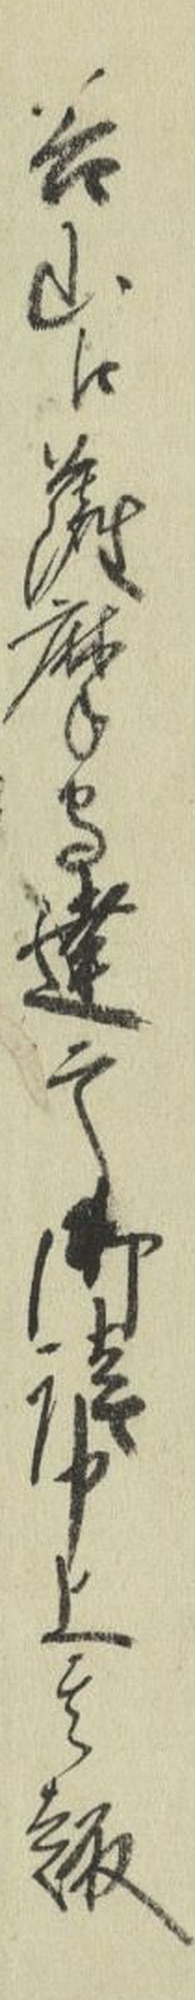谷山え薩摩守達之御請申上其趣
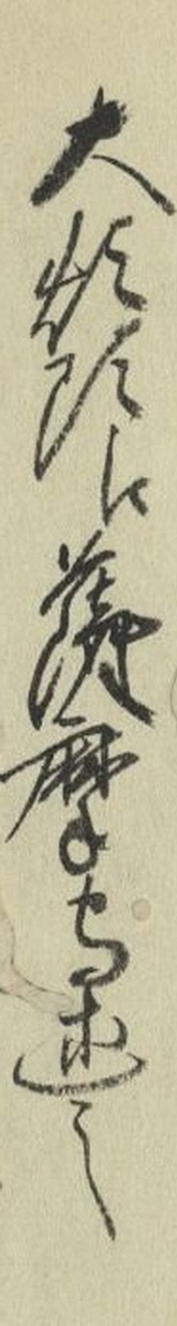大炊頭え薩摩守述之
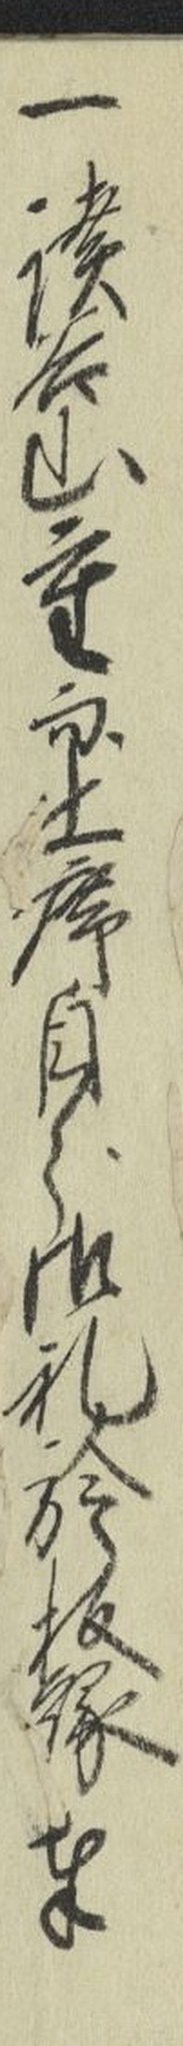一読谷山重而出席自分之御礼於板縁奉

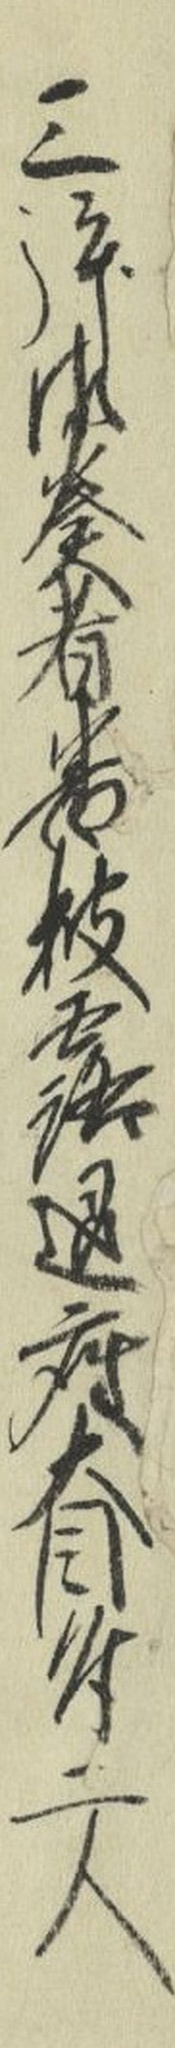三拝御奏者番披露退座大目付二人
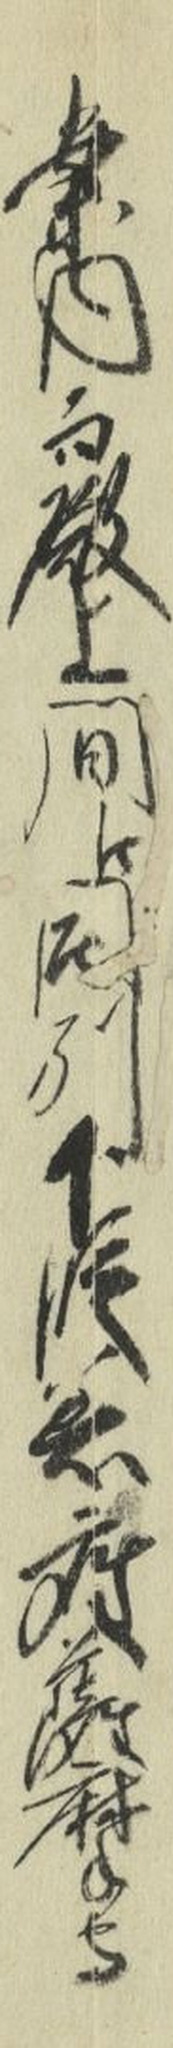案内而殿上間え同列下段着座薩摩守
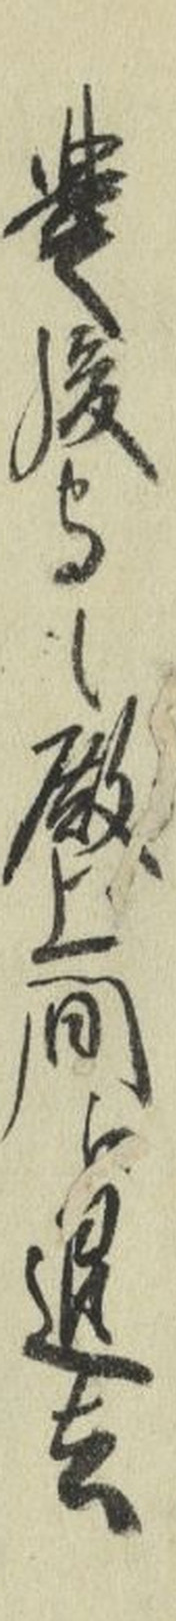豊後守も殿上間え退去
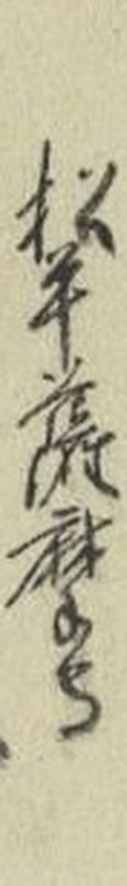松平薩摩守
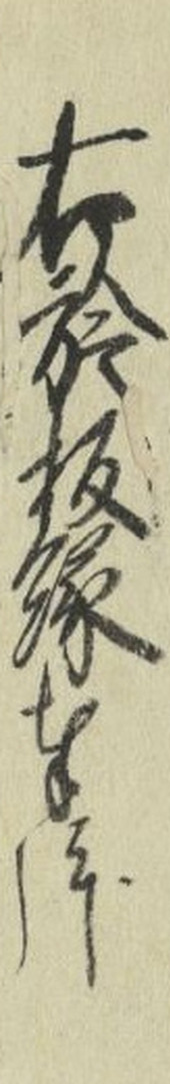右於板縁奉拝
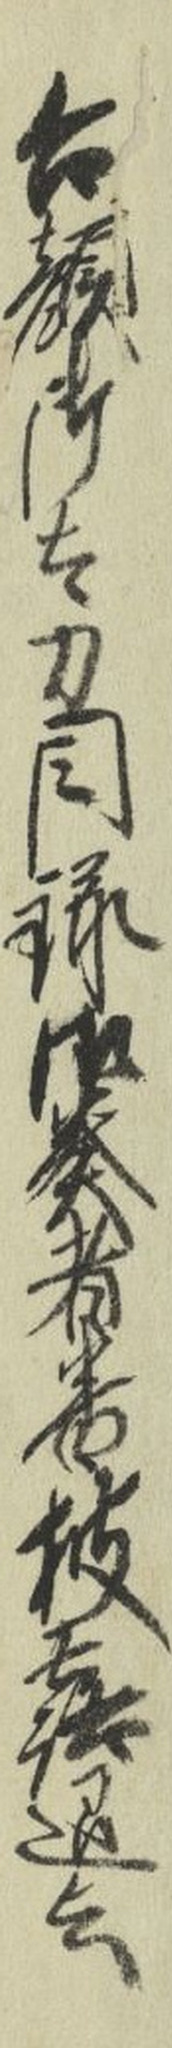台顔御太刀目録御奏者番披露退去
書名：琉球人御礼の次第
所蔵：University of the Ryukyus Library
